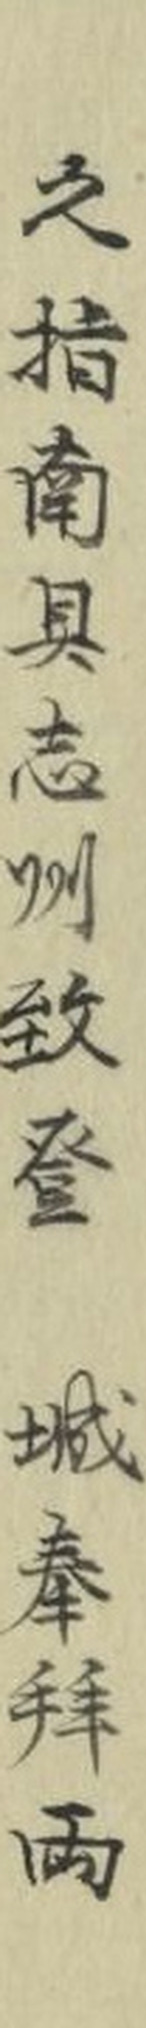之指南具志州致登城奉拝両
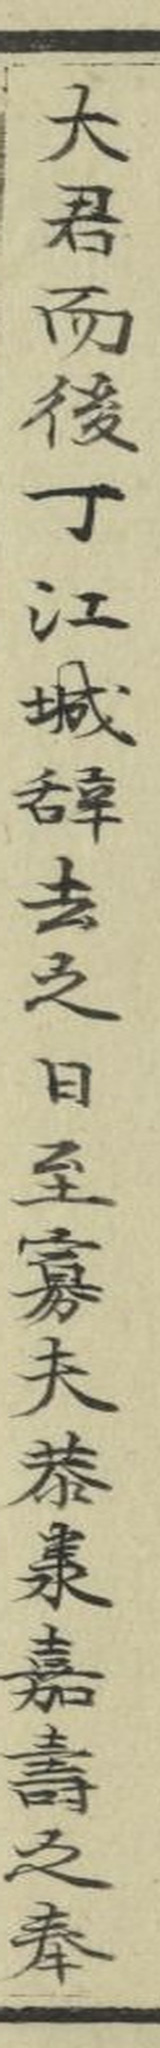大君而後丁江城辞去之日至寡夫恭承嘉寿之奉
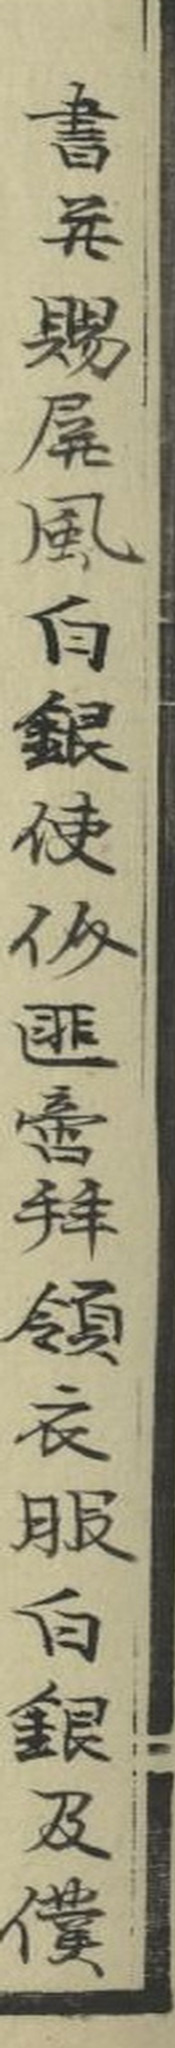書幷賜屏風白銀使价匪啻拝領衣服白銀及僕
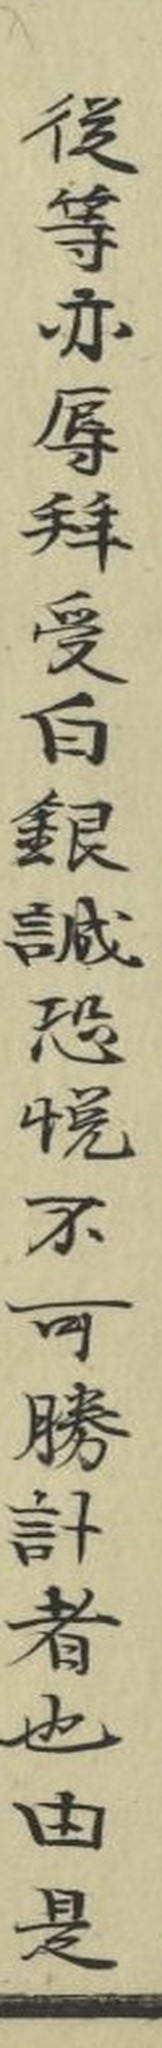従等亦辱拝受白銀誠恐悦不可勝計者也由是
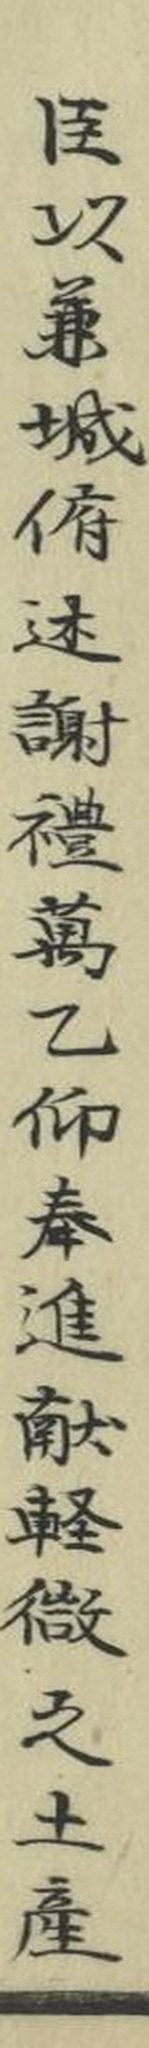臣以兼城俯述謝礼万乙仰奉進献軽徴之土産
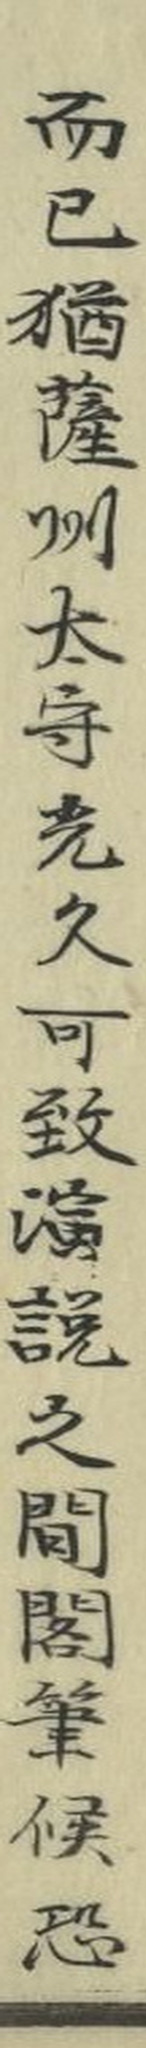而巳猶薩州太守充久可致演説之間閣筆候恐
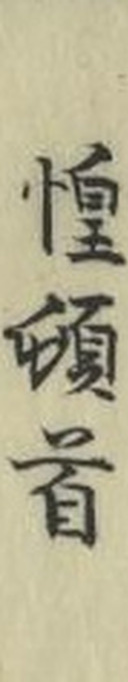惶頓首
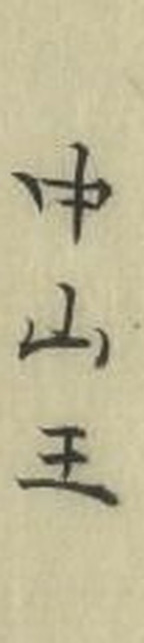中山王
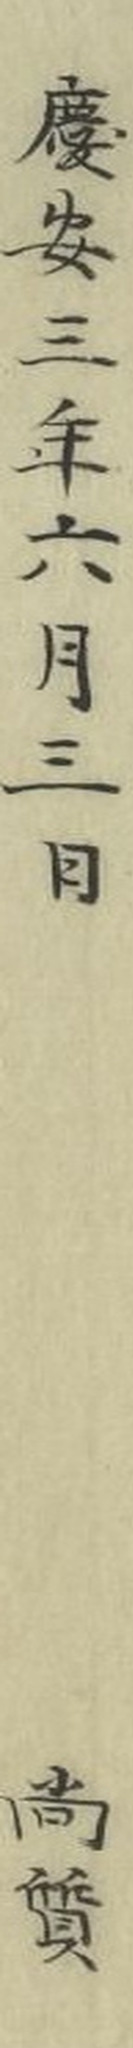慶安三年六月三日尚質
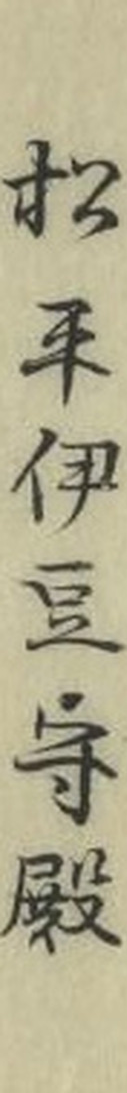松平伊豆守殿
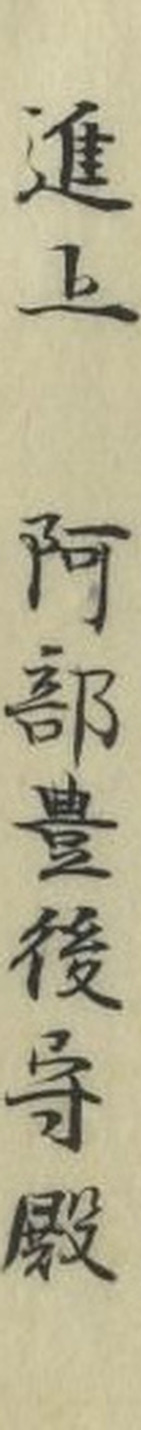進上阿部豊後守殿
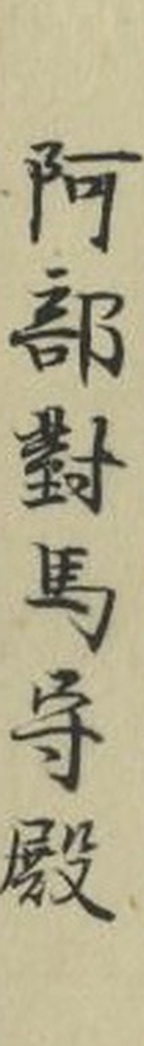阿部對馬守殿

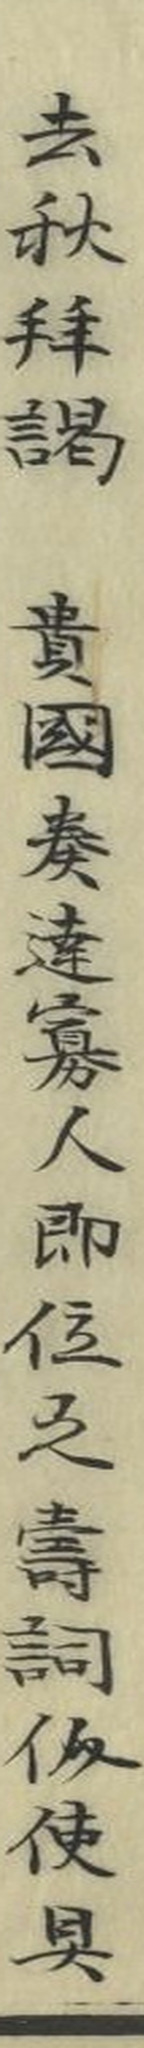去秋拝謁貴国奏達科寡人即位之寿詞价使具
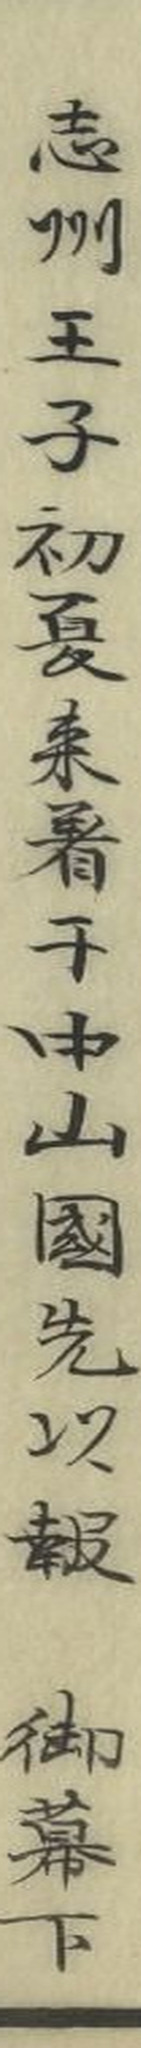志州王子初夏来着于中山国先以報御幕下
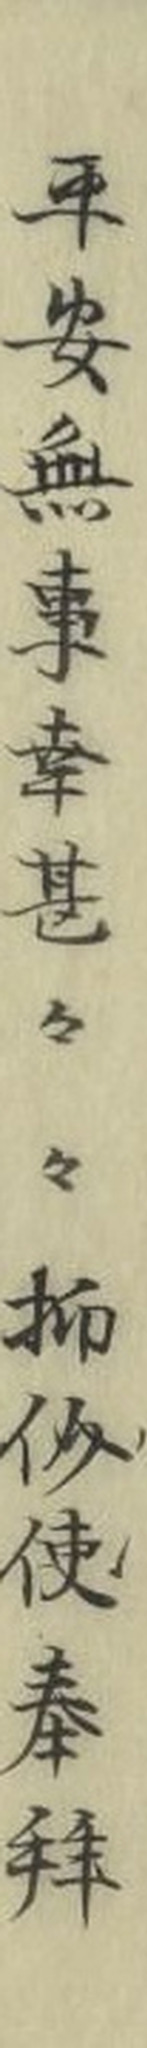平安無事幸甚々々抑价使奉拝
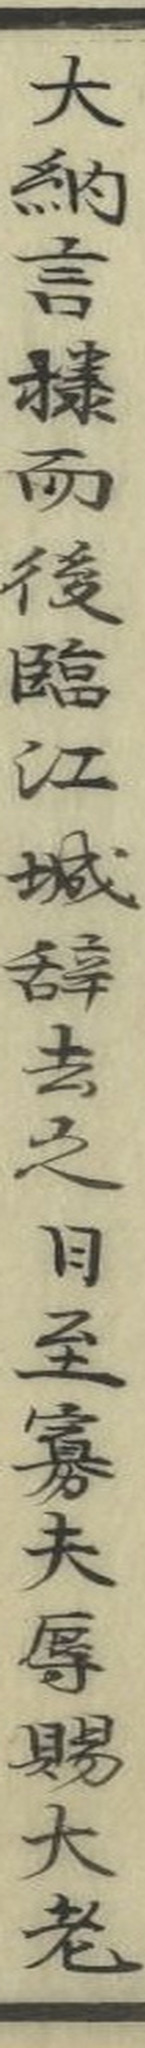大納言様而後臨江城辞去之日至寡夫辱賜大老
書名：琉球往来（上）
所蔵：University of the Ryukyus Library
